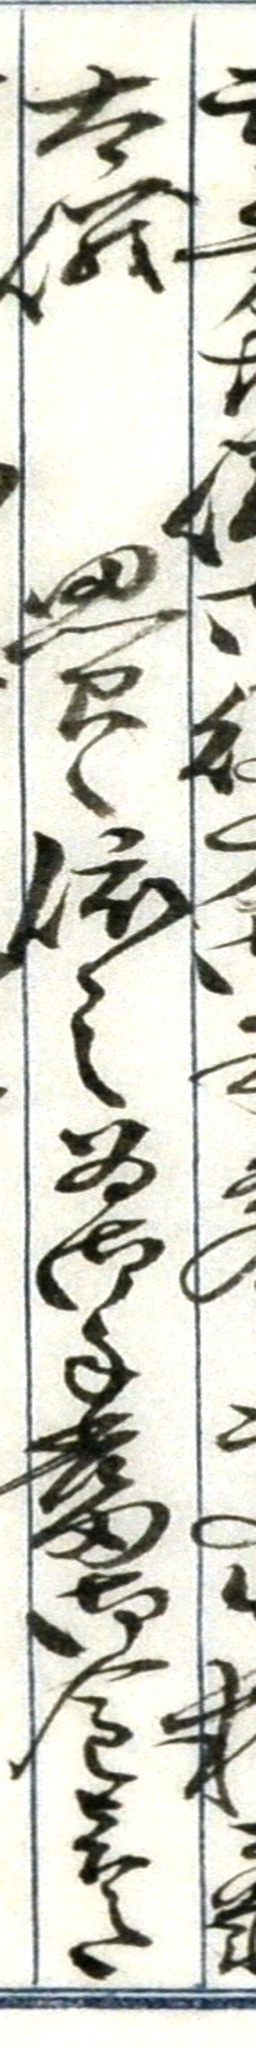太儀思召候依之為御手當御金被下之候
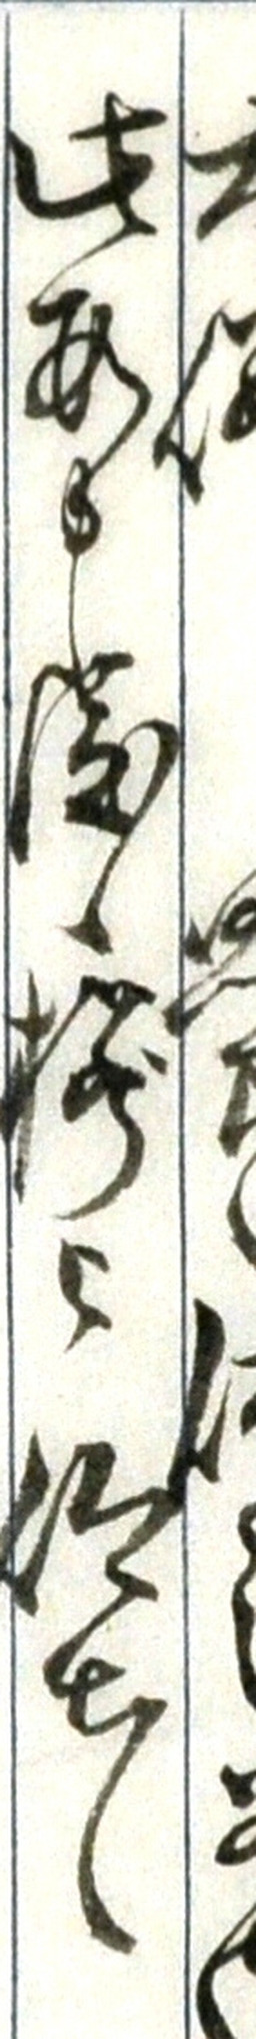此如申渡候様被仰出候
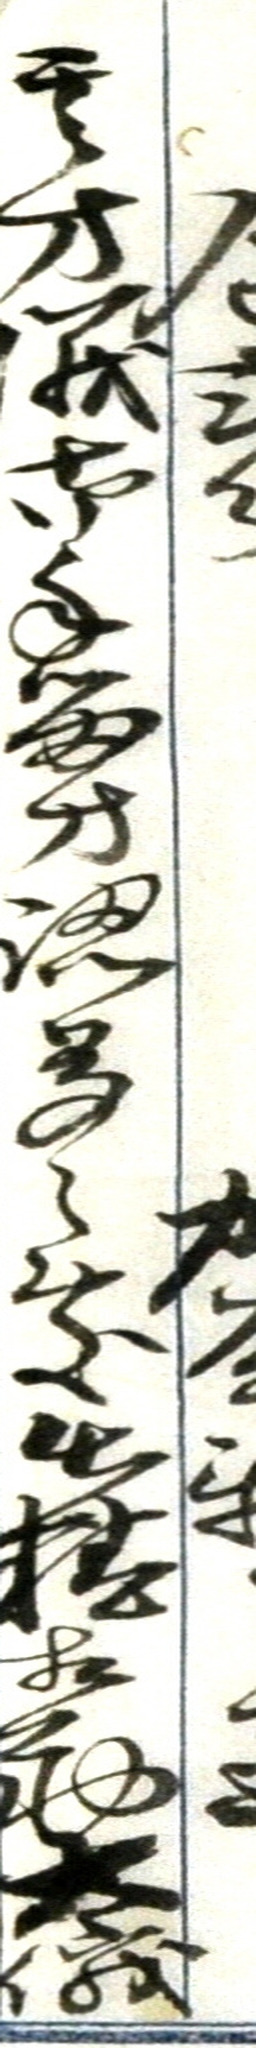其方儀御手當方認多之處出精相勤太儀

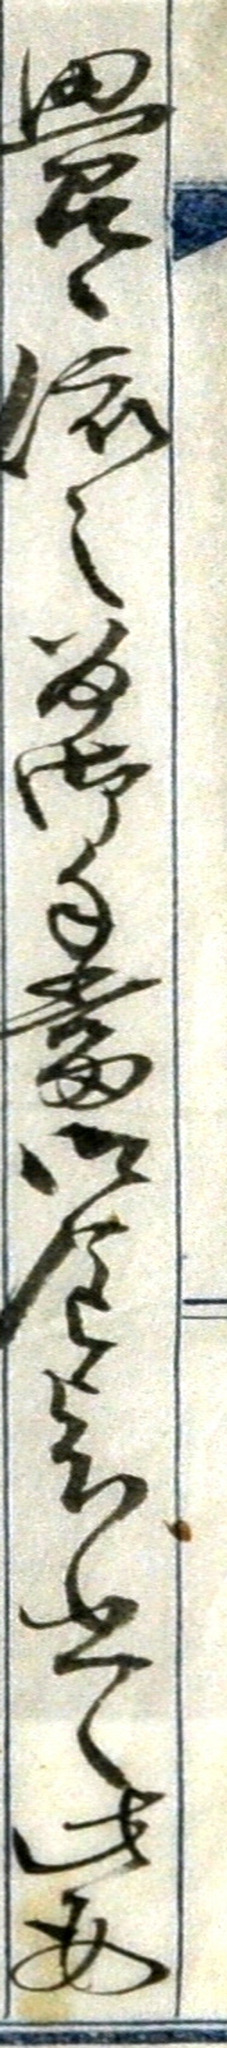思召候依之為御手當御金被下之候此如
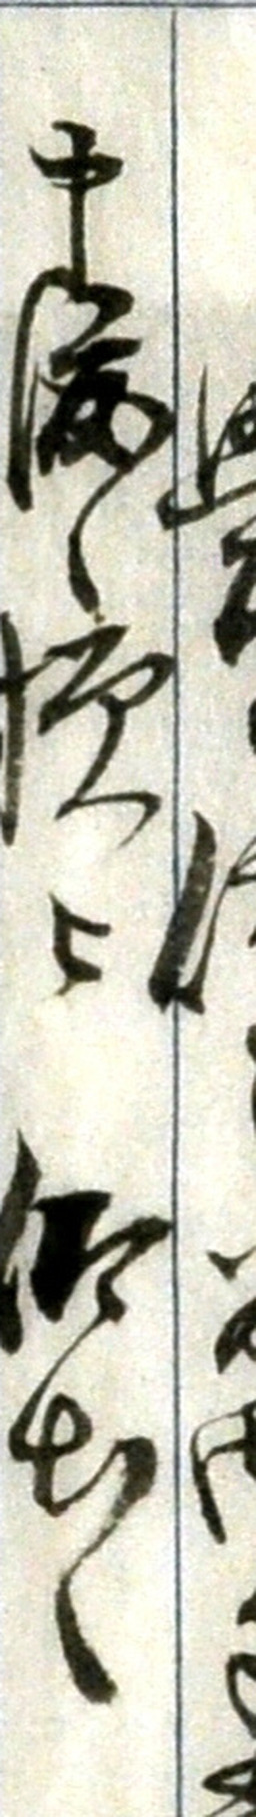申渡候様被仰出候
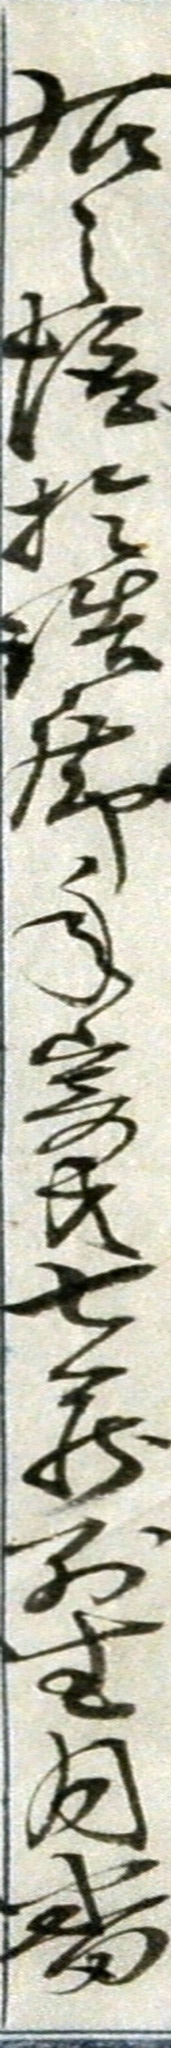右之趣於詰席年寄共七蔵列座月番
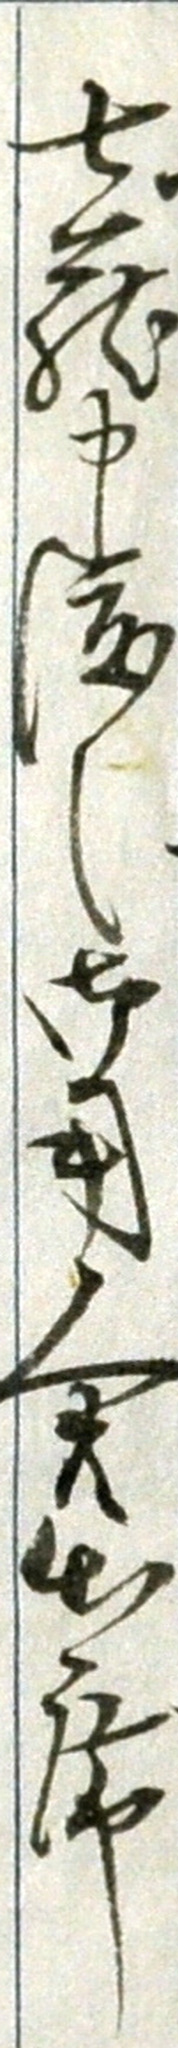七蔵申渡し御用人共出席
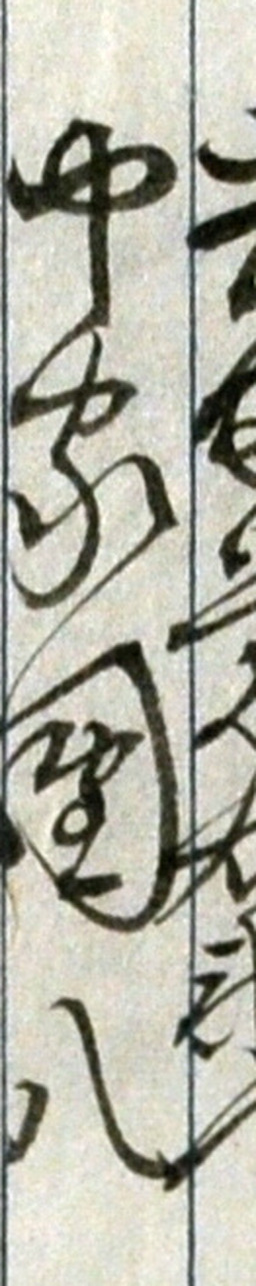中家団八
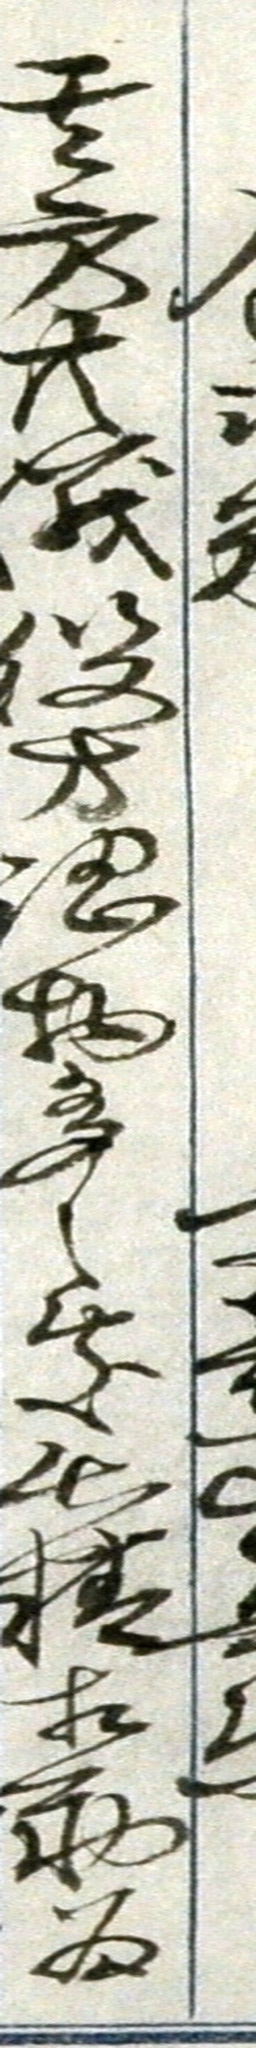其方共役方認物多之處出精相勤為
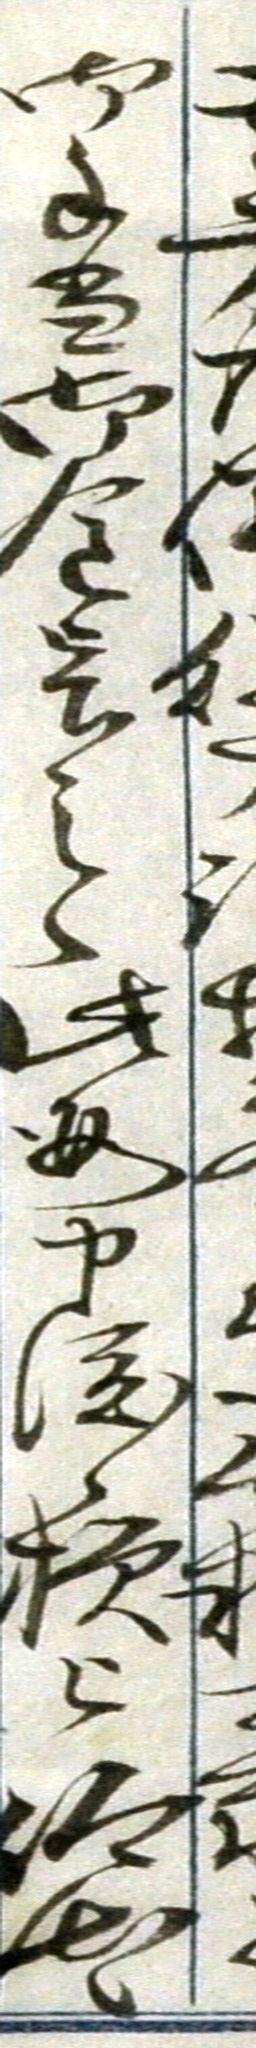御手當御金被下之候此如申渡候様被仰出候
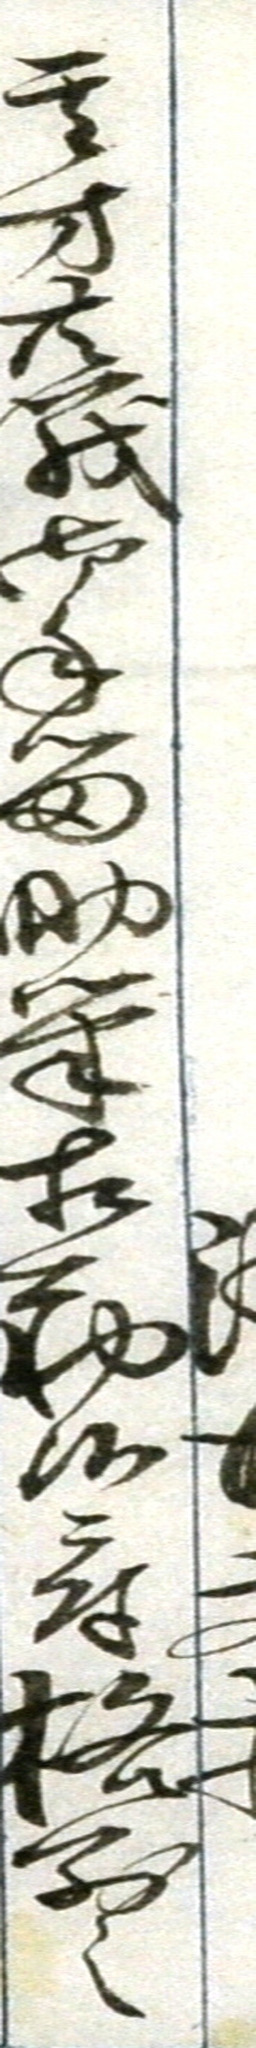其方共儀御手留助筆相勤候ニ付格別之
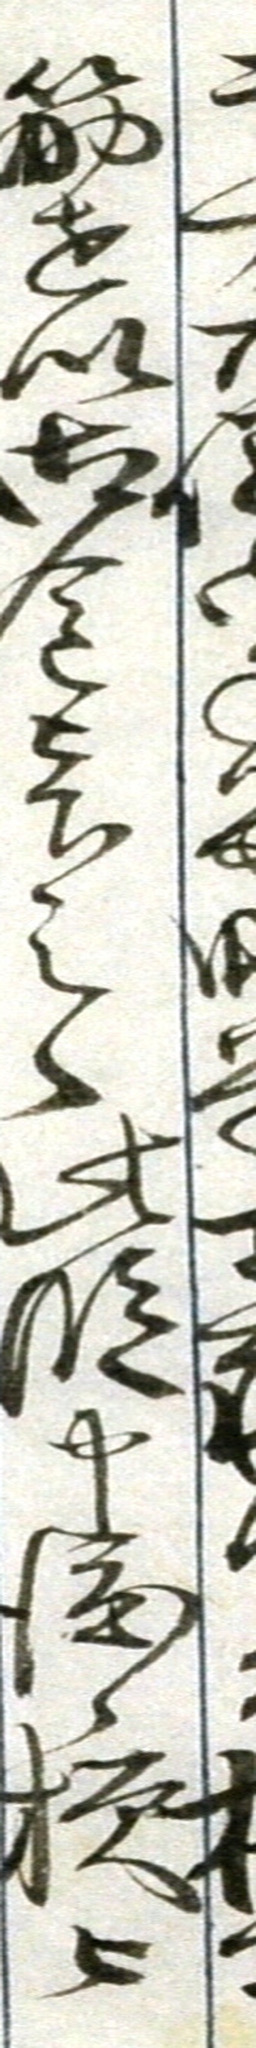筋を以御金被下之候此段申渡候様被
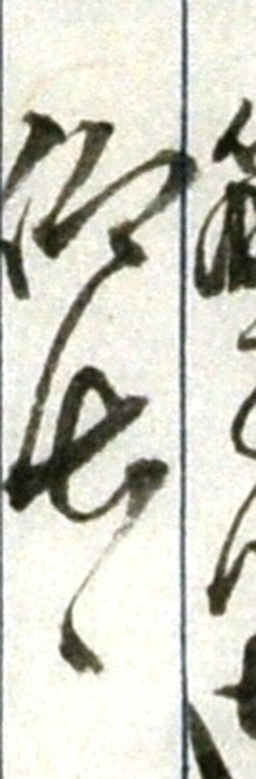仰出候
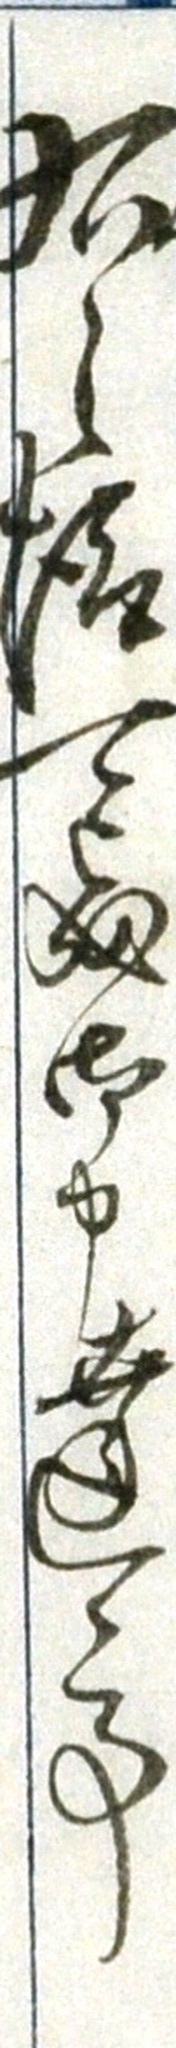右之趣可被成御申達候事
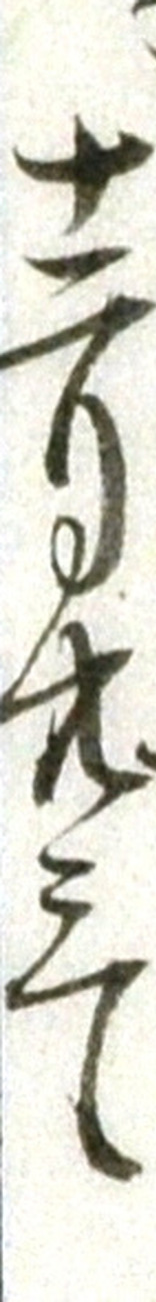十二月廿三日
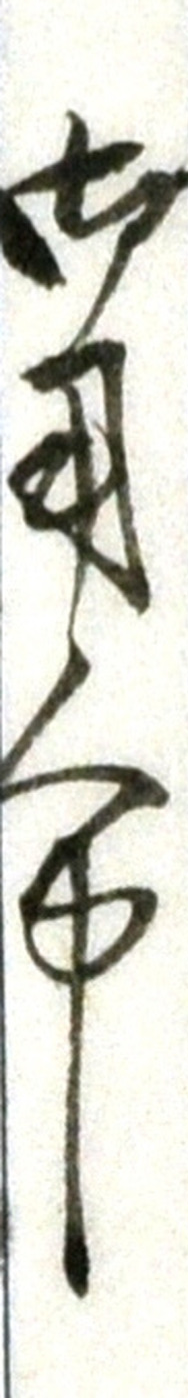御用人中
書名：上方ヨリ御帰府之後江戸勤并江戸在番中之者江被下・控
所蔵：伊那市立高遠町図書館・合同会社AMANE
